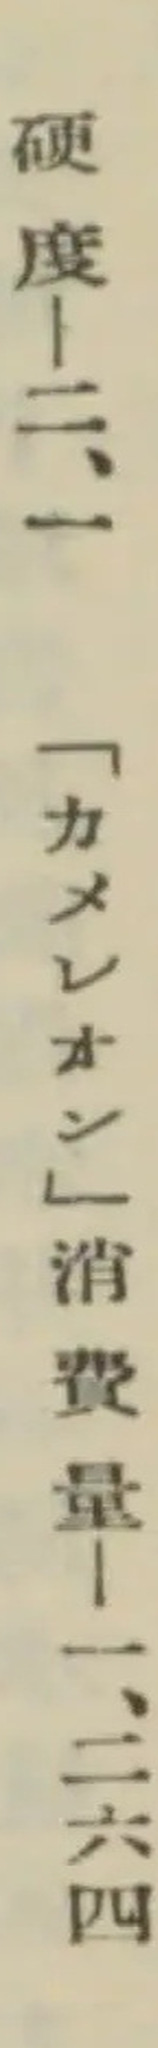硬度ー二一「カメレオン」消費量ー一、二六四
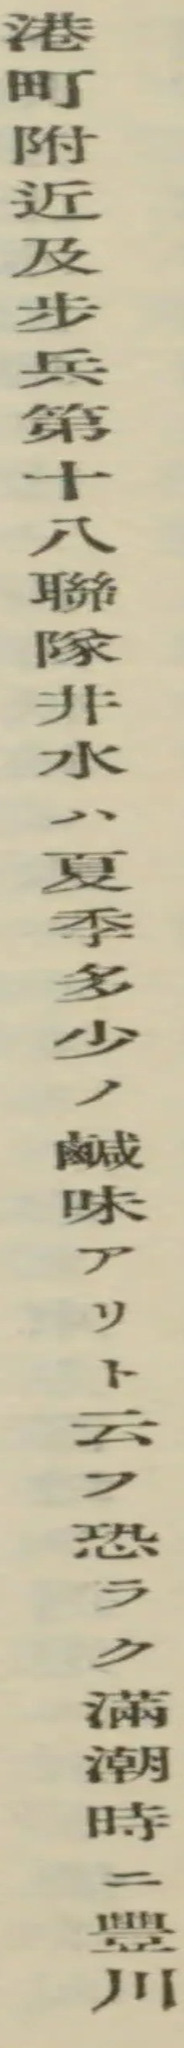港町附近及歩兵第十八連隊井水は夏季多少の鹹味ありと云ふ恐らく満潮時に豊川
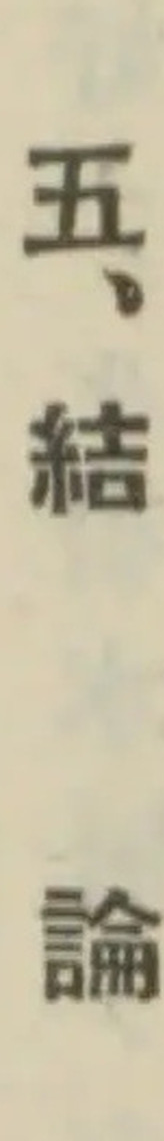五、結論
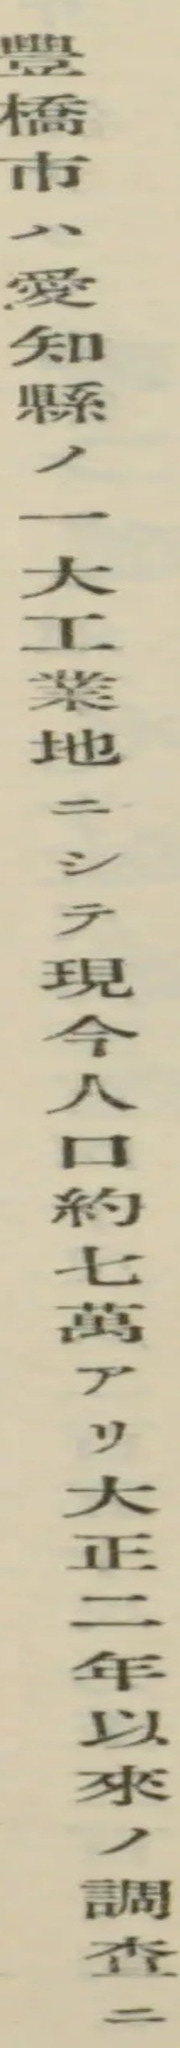豊橋市は愛知県の一大工業地にして現今人口約七萬あり大正二年以来の調査に
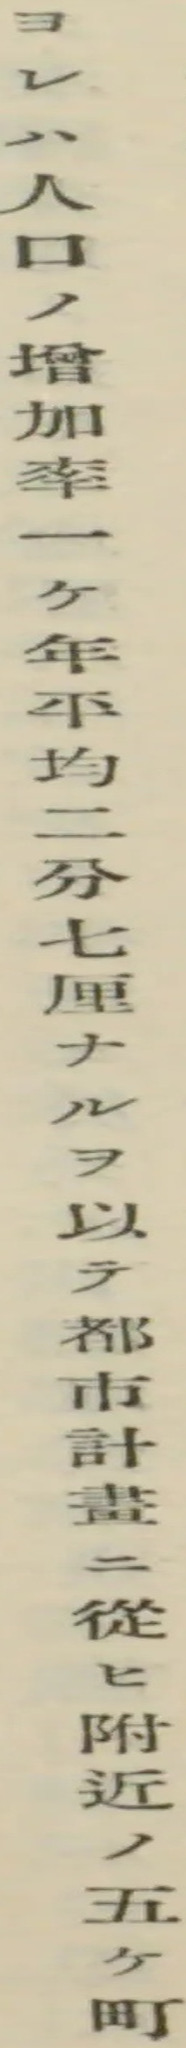よれは人口の増加率一カ年平均二分七厘なるを以て都市計画に従ひ附近の五ケ町
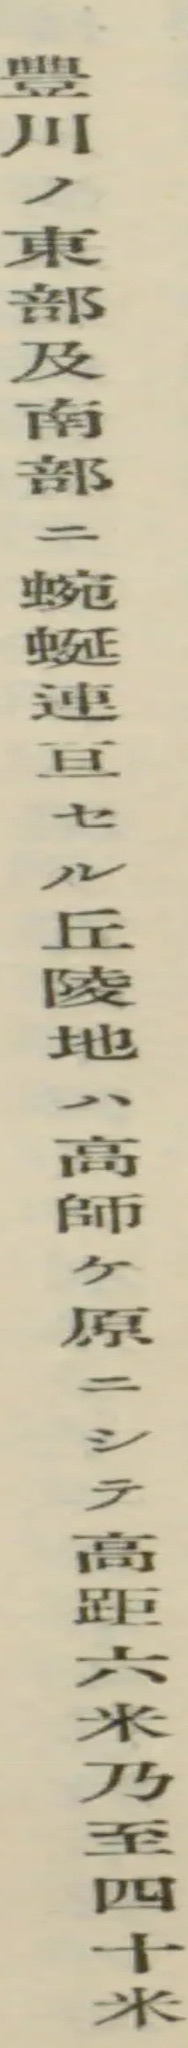豊川の東部及南部に蜿蜒連亘せる丘陵地は高師ケ原にして高距六米乃至四十米
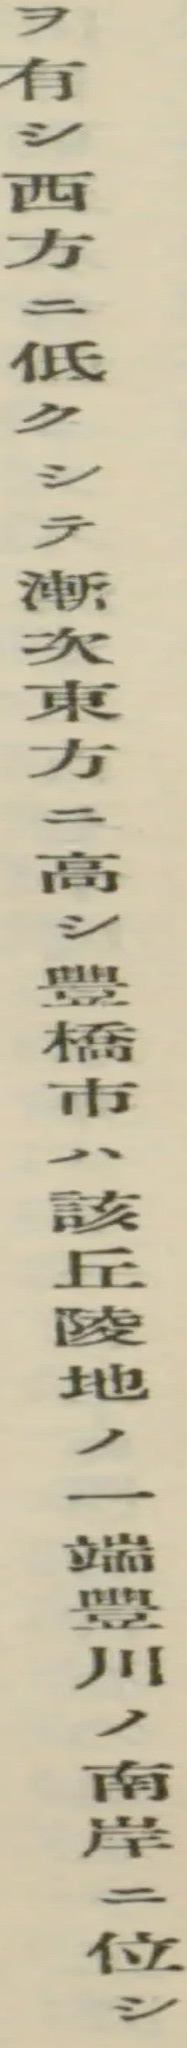を有し西方に低くして漸次東方に高し豊橋市は該丘陵地の一端豊川の南岸に位し
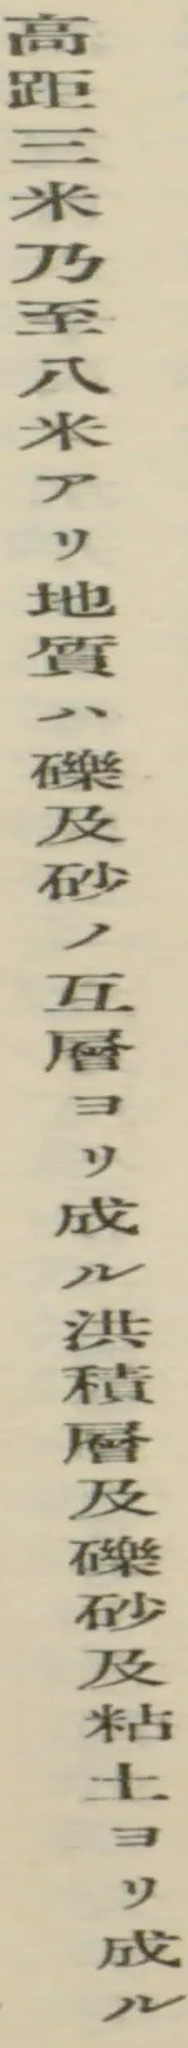高距三米乃至八米あり地質は礫及砂の互層より成る洪積層及礫砂及粘土より成る
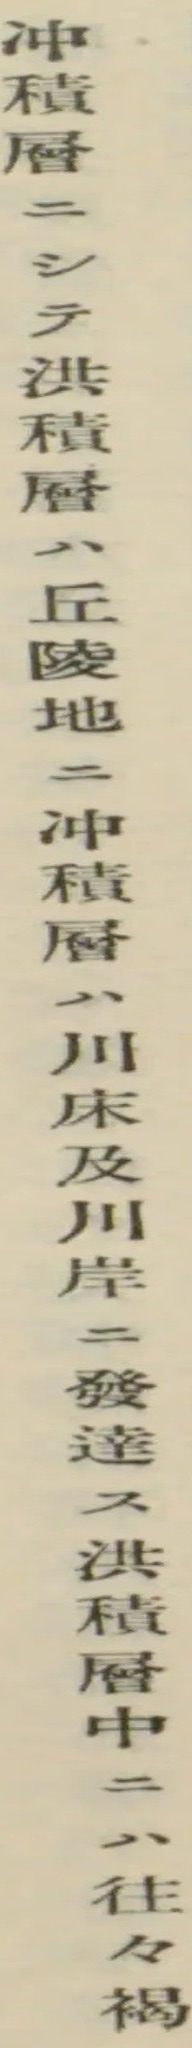沖積層にして洪積層は丘陵地に沖積層は川床及川岸に発達す洪積層中には往々褐
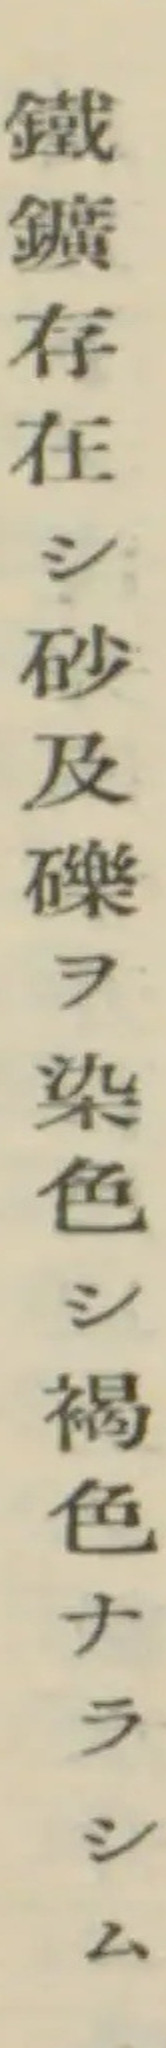鐵鑛存在し砂及礫を染色し褐色ならしむ
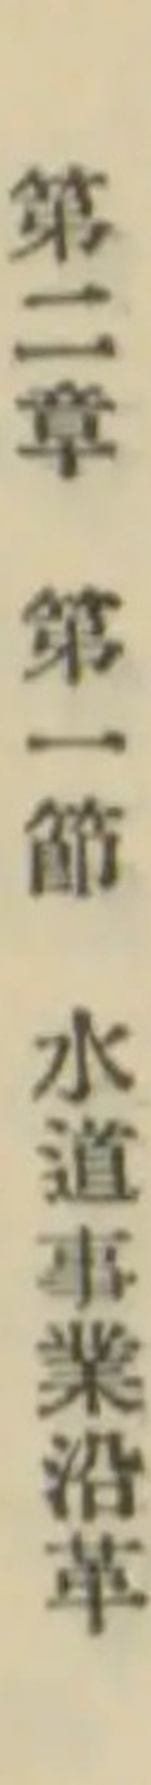第二章第一節水道事業沿革二四

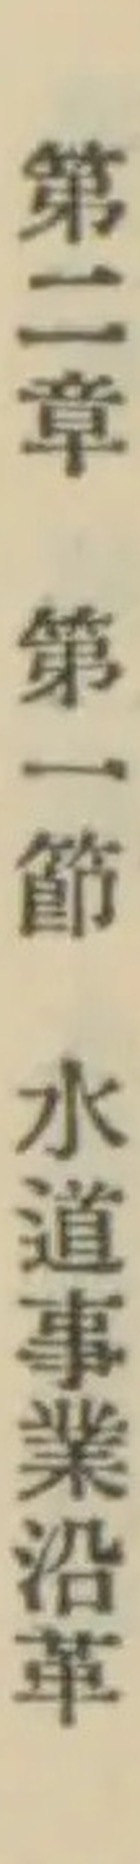第二章第一節水道事業沿革
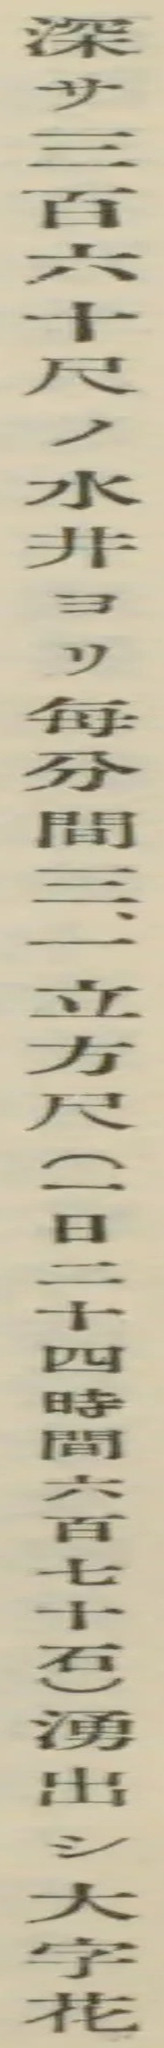深さ三百六十尺の水井より毎分三、一立方尺(一日二十四時間六百七十石)湧出し大字花
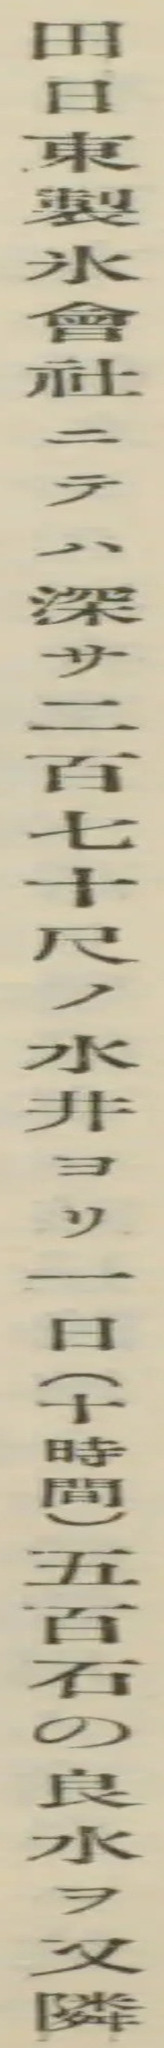田日東製氷会社にては深さ二百七十尺の水井より一日(十時間)五百石の良水を又隣
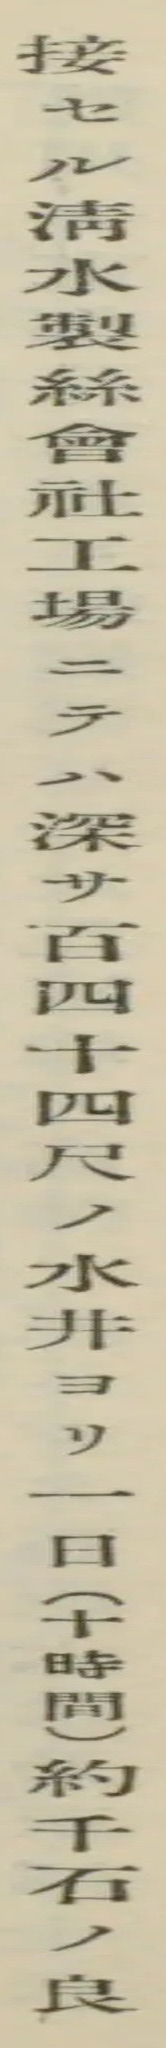接せる清水製絲会社工場にてはふ深さ百四十四尺の水井より知日(十時間)約千石の良
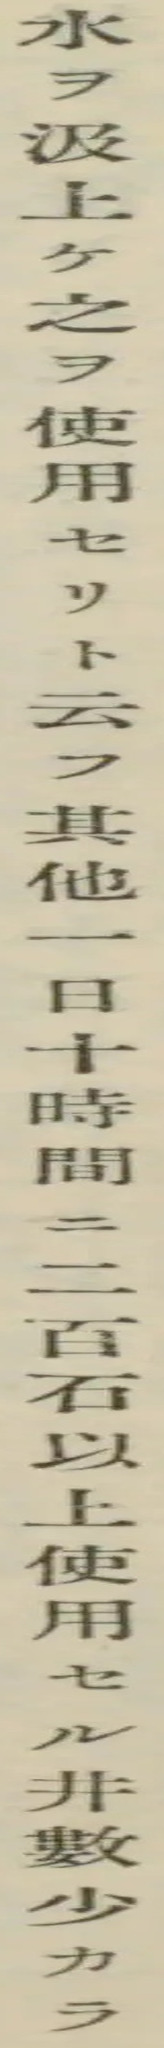水を汲上け之を使用せりと云ふ其他一日十時間に二百石以上使用せる井数少から
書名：豊橋市水道誌
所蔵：国立国会図書館 National Diet Library, JAPAN
